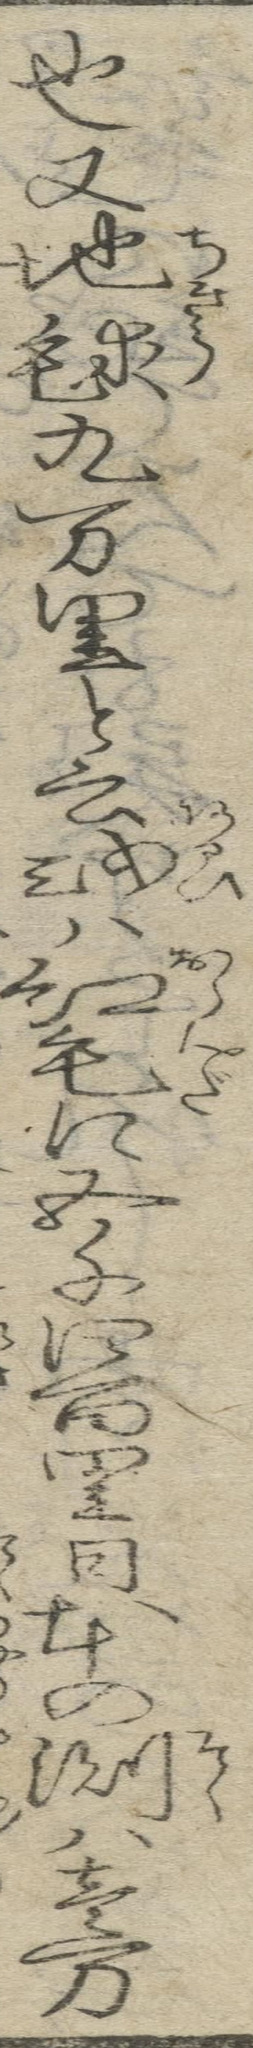也又地毬九万里と云或は紅毛に五千四百里日本の測は壱万
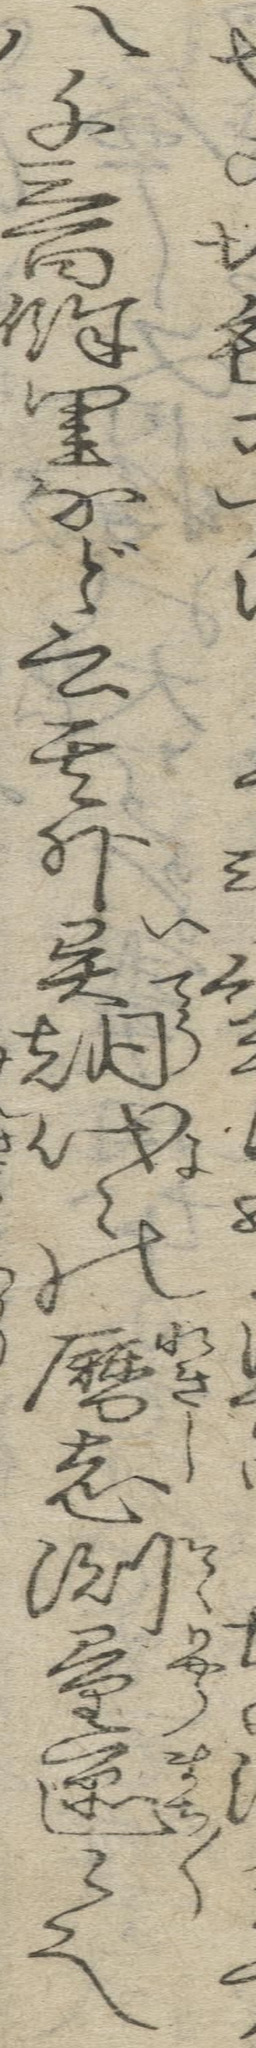八千三百余など云其外異朝代々の暦志測量区々（まち
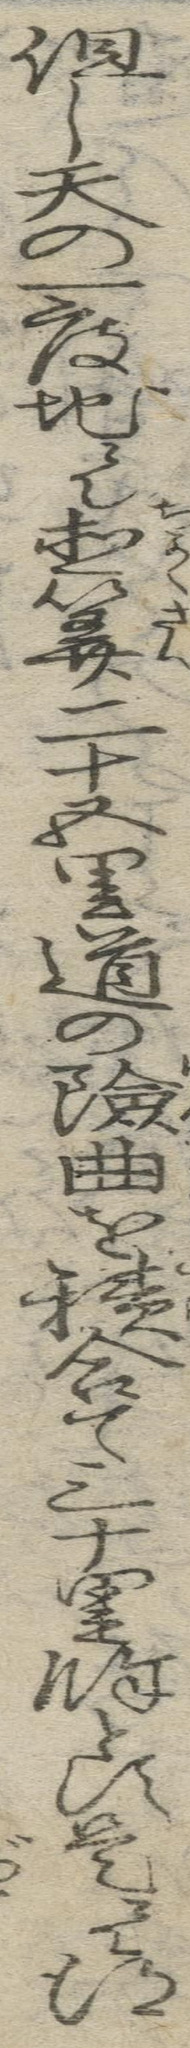但し天の一度地にて直算二十五里道の険曲を積合て三十余りとす是にて得べし
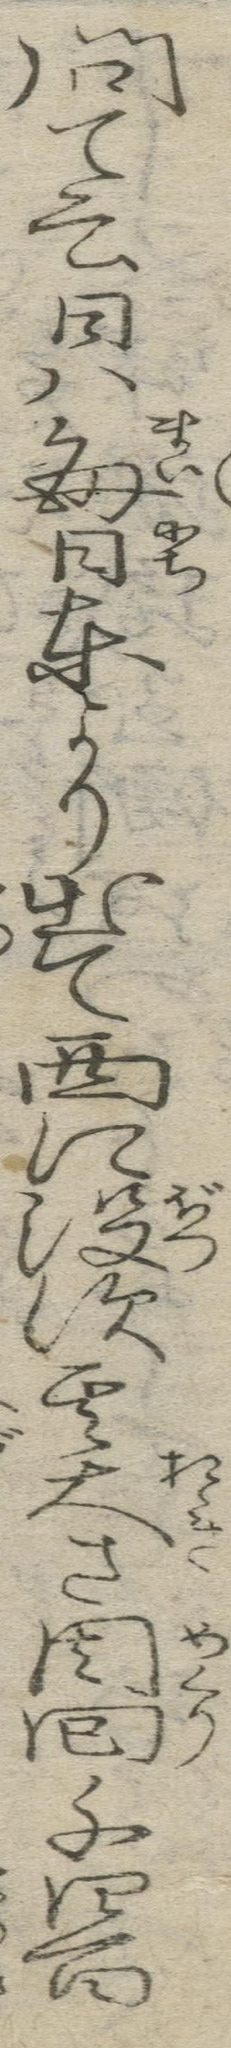問て云日は毎日東より出て西に没す其大さ周回千四百
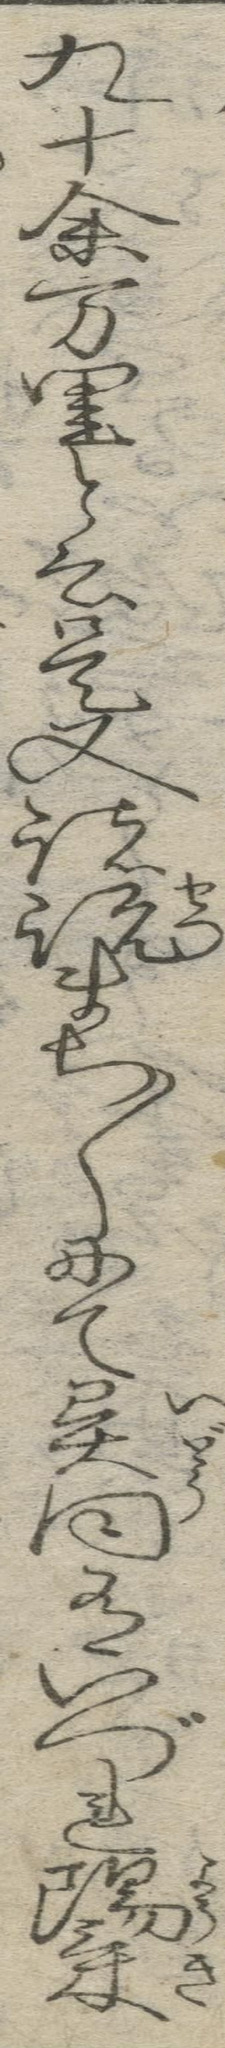九十余万里と云是又諸説まち〳〵にて異同有いづれ陽気
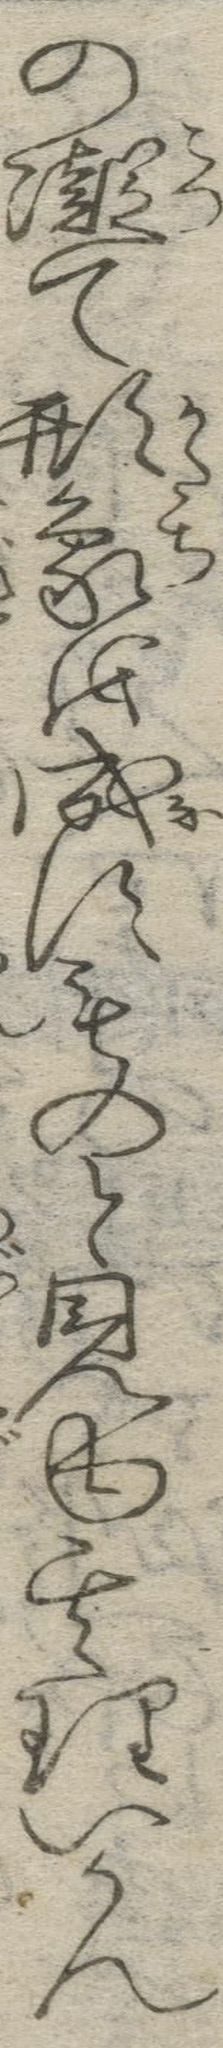の凝て形象を成すものと見ゆ其理いかん
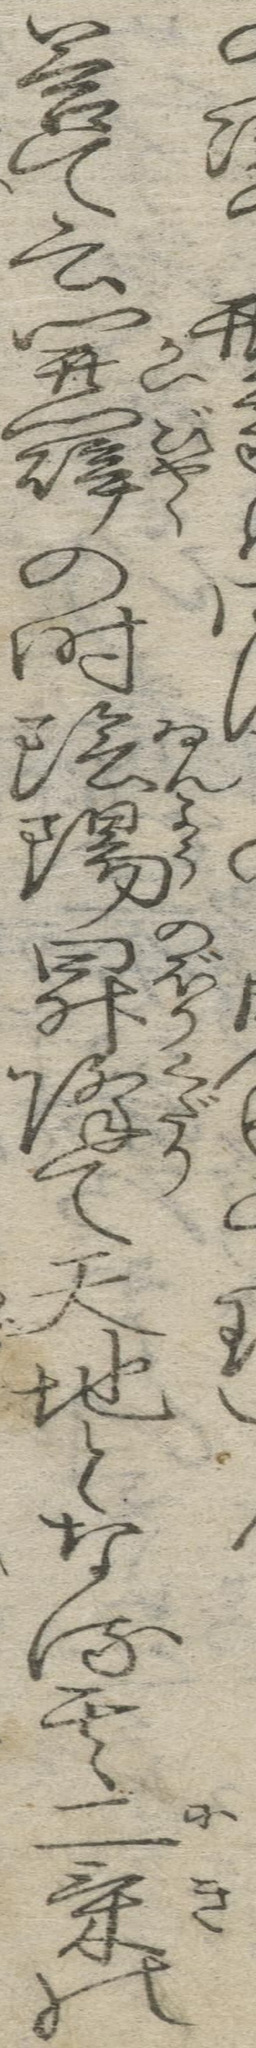答て云開闢の時陰陽昇降て天地となる其二気の
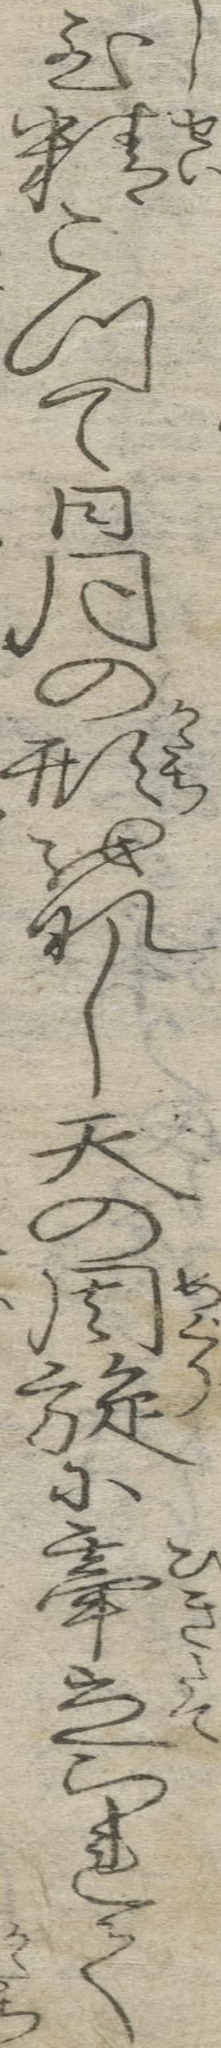至精こつて日月の形をなし天の周旋に牽立られて
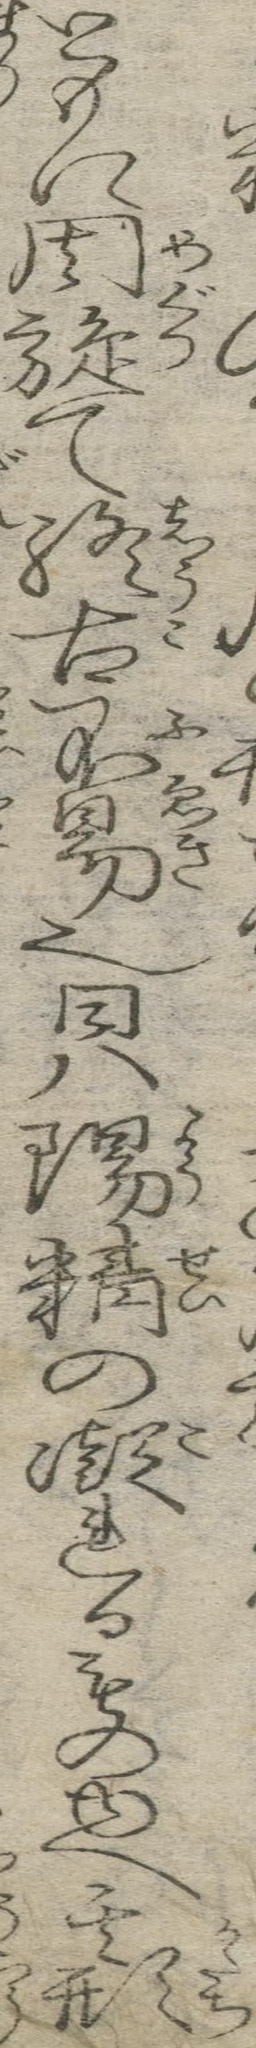ともに周旋て終古不易也日は陽精の凝れるものゆへ其形
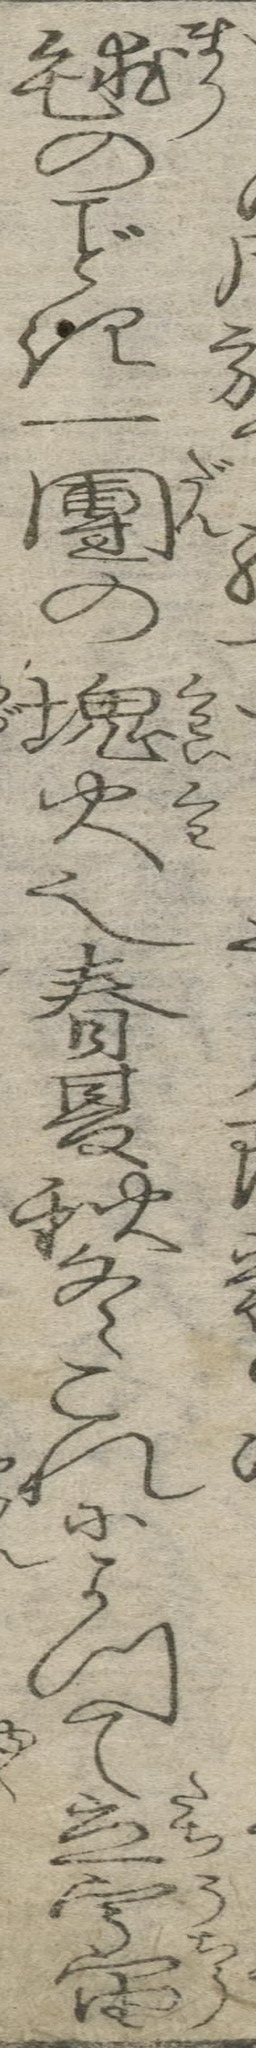毬のごとき一団の塊火也春夏秋冬これによつて立宇宙
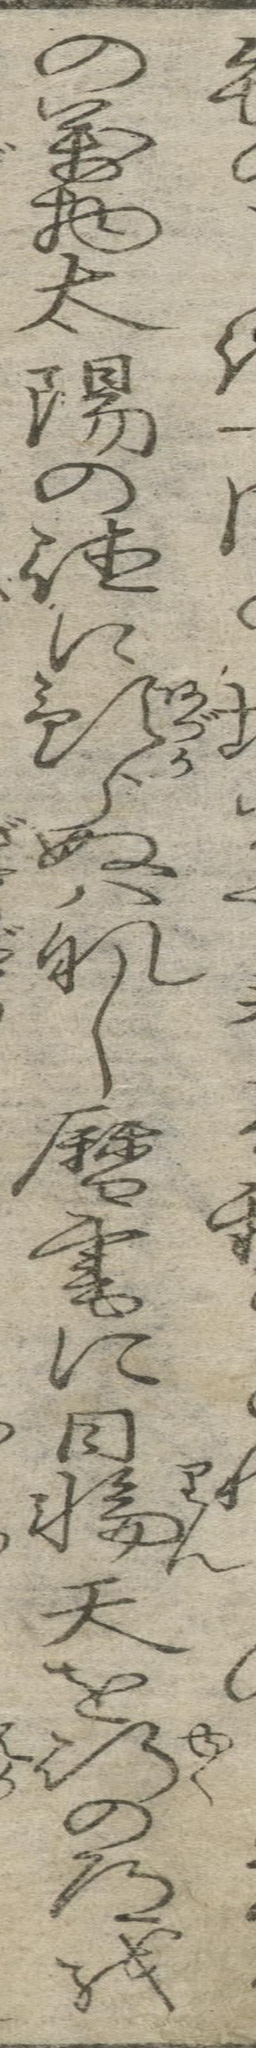の万物太陽の徳に預らぬはなし暦書に日輪天を行の道を
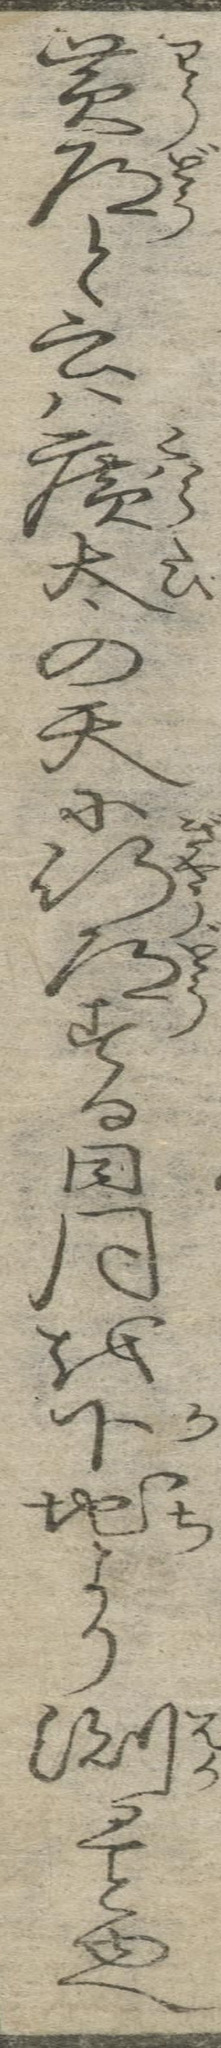横道と云は宏太の天に行道する日月を下地より測ることゆへ

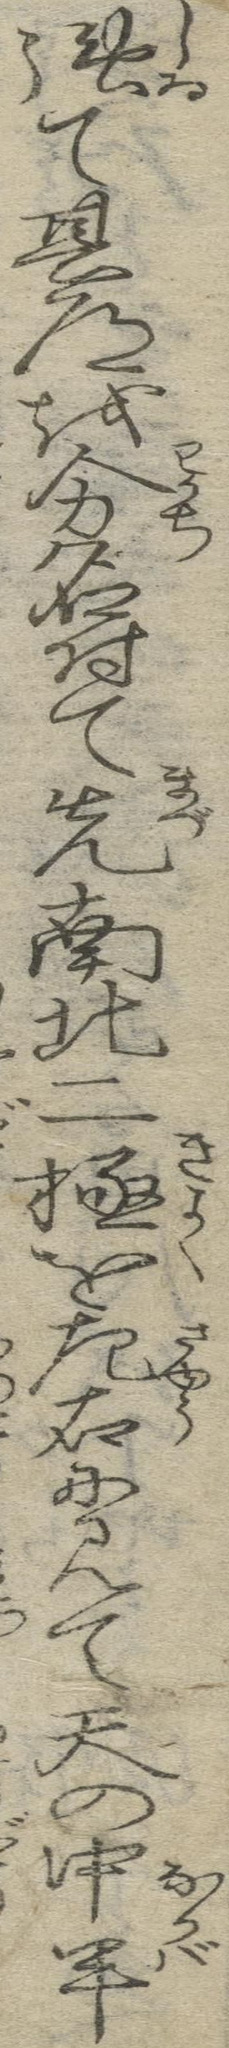強て其道を分名付て先南北二極を左右に見て天の中半
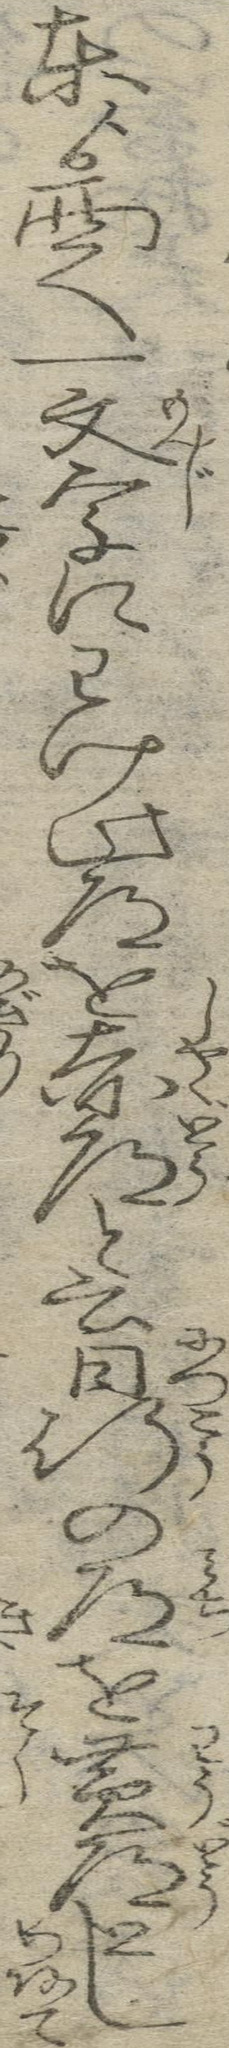東ゟ西へ一文字にわけ此道を赤道と云日行の道を横道とし
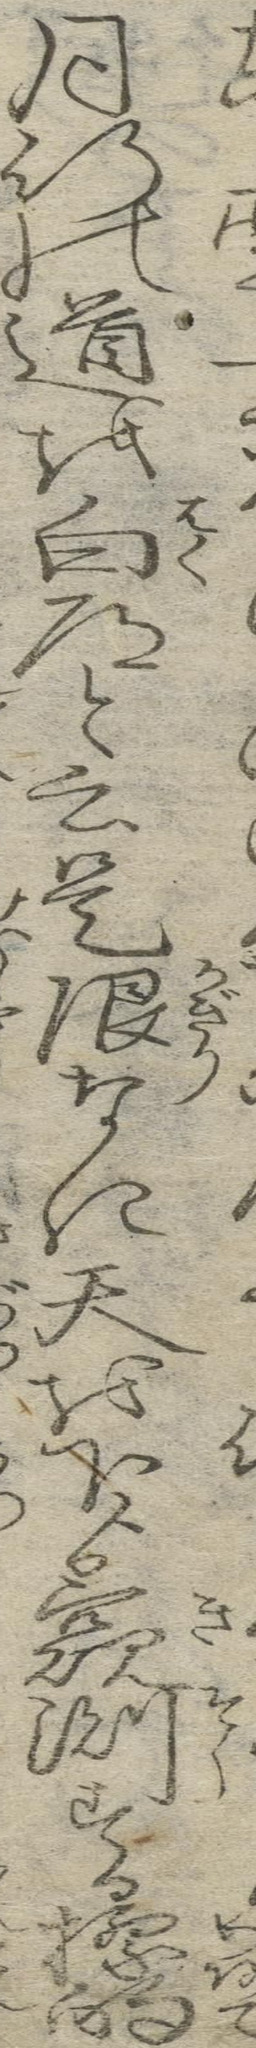月行の道を白道と云是限なき天を下ゟ窺測する標的
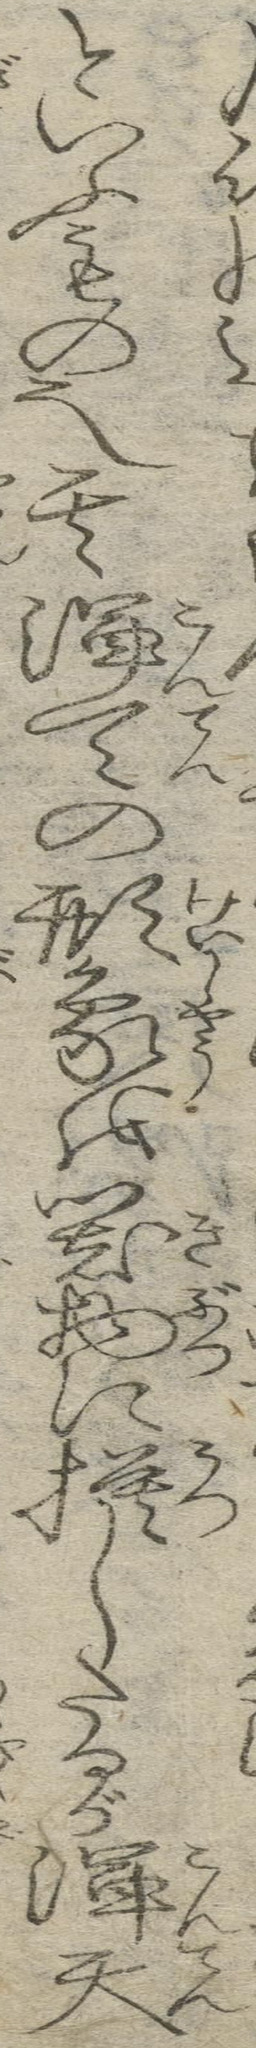といふもの也其渾天の形象を器物に模したるが渾天
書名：訓蒙天地辨　天
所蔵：東京大学地震研究所図書室 Earthquake Research Institute Library, The University of Tokyo, JAPAN
